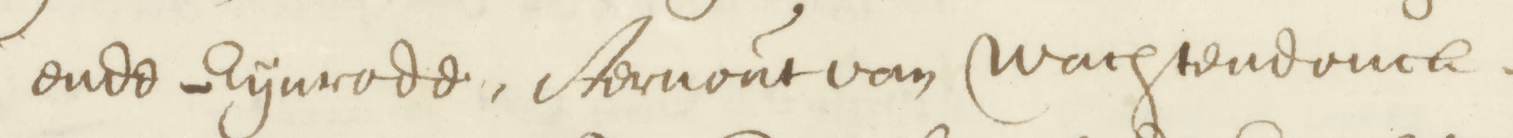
ende Rijnrode, Aernout van Wachtendonck
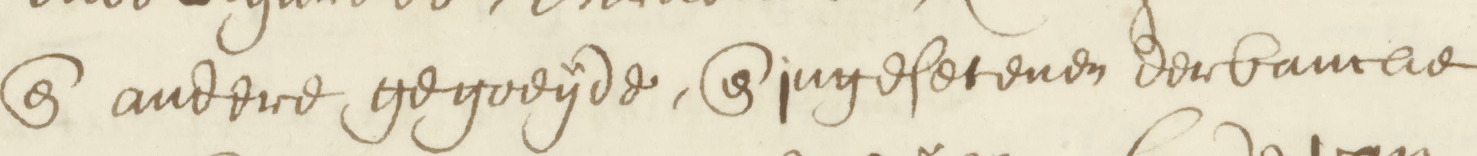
& andere gegoeijde, & ingesetenen der bancke
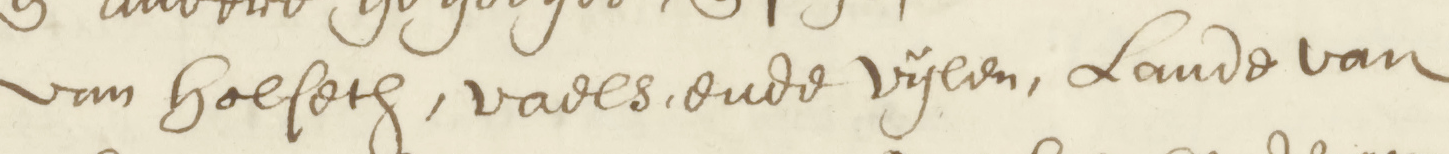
van holseth, vaels, ende vijlen, Lande van
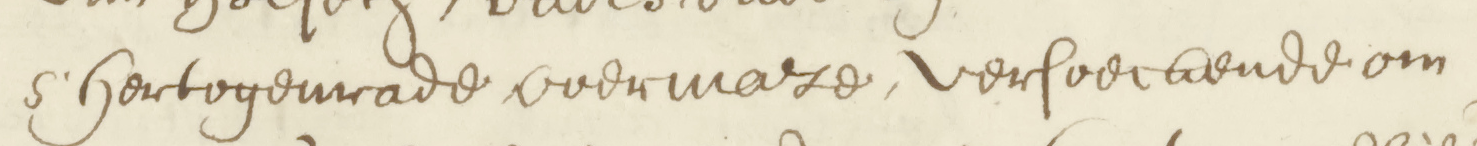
s‛hertogenrade overmaze, versoeckende om
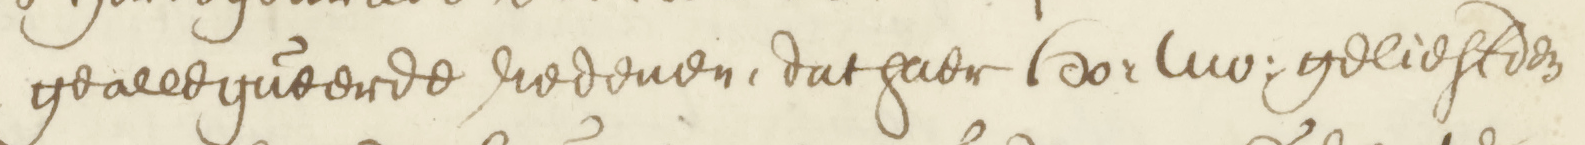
geallegueerde redenen, dat haer ho:mo: gelieffden
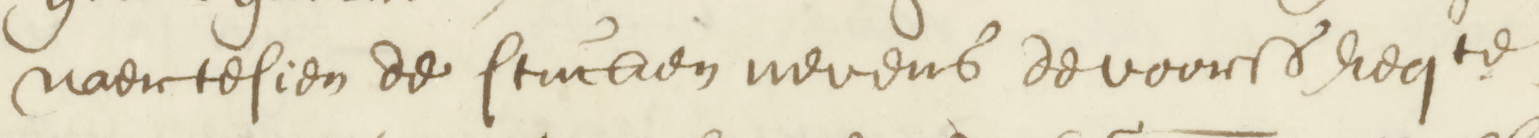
naer te sien de stucken nevens de voors. reqte
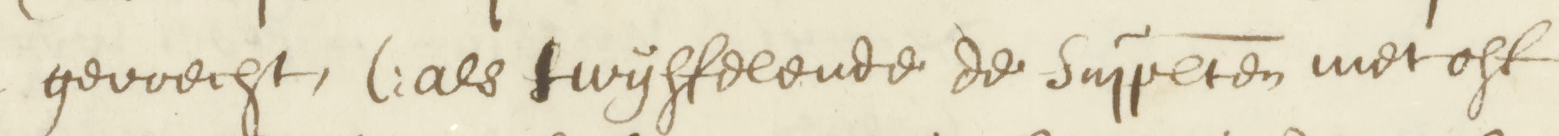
gevoecht, (: als twijffelende de Supplten met oft
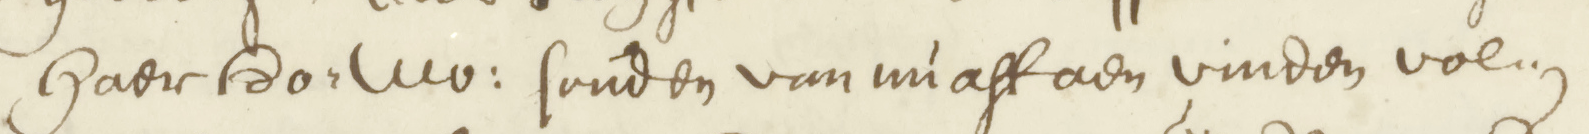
haer ho:mo: souden van nu aff aen vinden vol„
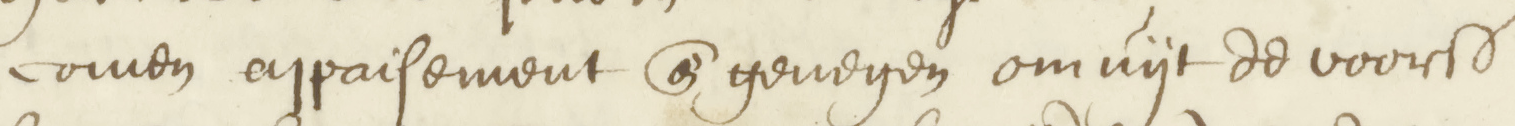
comen appaisement & genegen om uijt de voors.
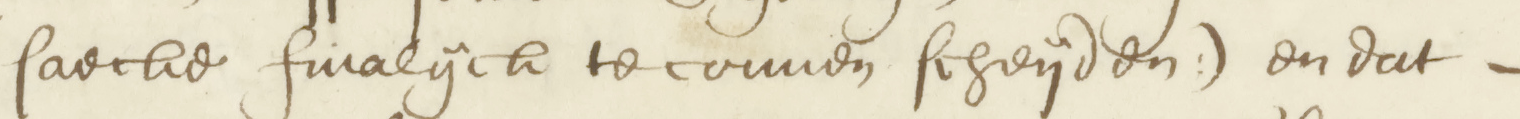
saecke finalijck te connen scheijden:) en dat
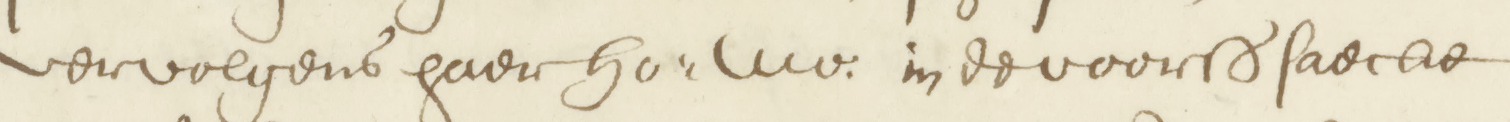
vervolgens haer ho:mo: in de voors. saecke
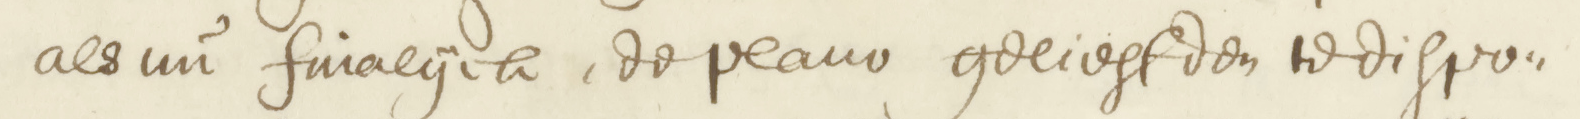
als nu finalijck, de plano gelieffden te dispo„
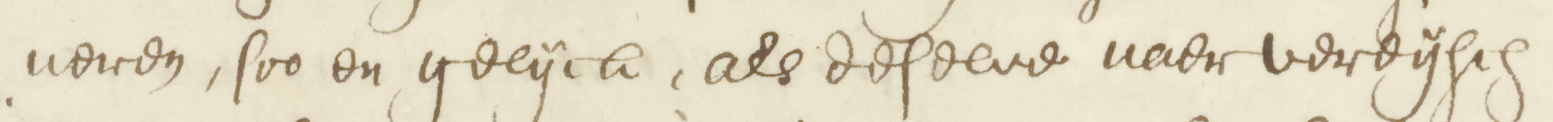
neren, soo en gelijck, als deselve naer vereijsch
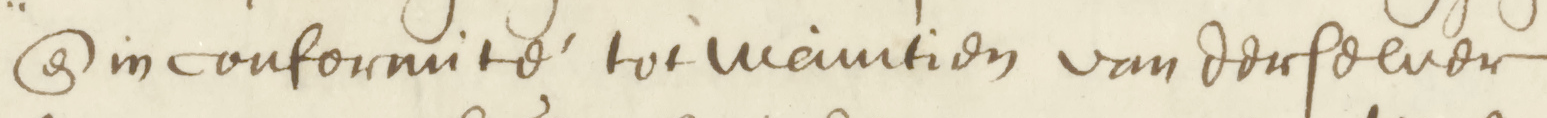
& in conformité tot maintien van derselver
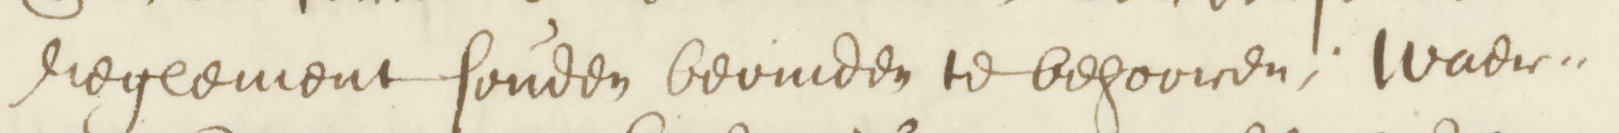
reglement souden bevinden te behooren; Waer„
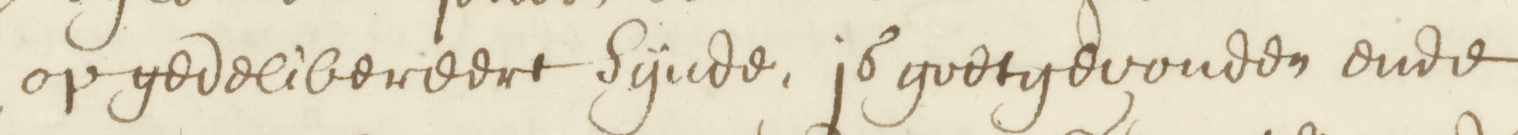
op gedelibereert Sijnde, is goetgevonden ende
